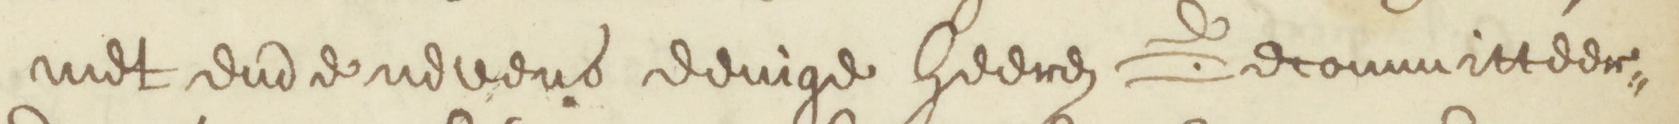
met ende nevens eenige heeren Gecommitteer„
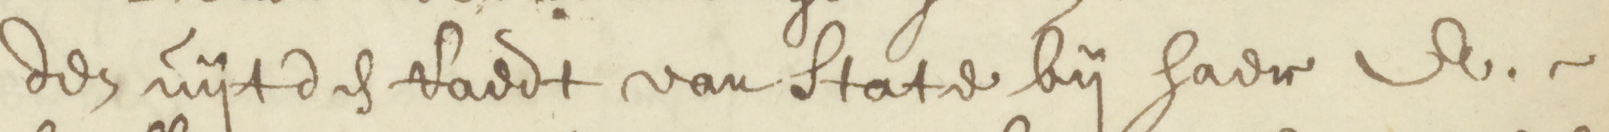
den uijt den Raedt van State bij haer E.
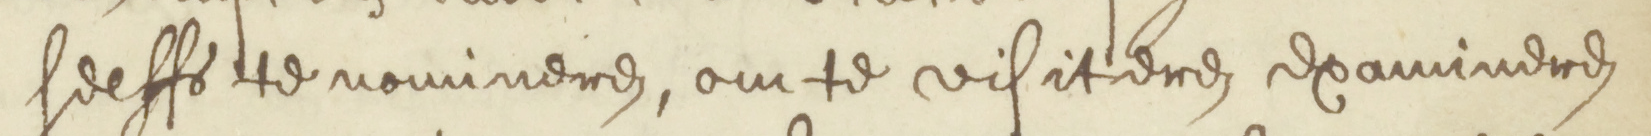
selffs te nomineren, om te visitieren examineren
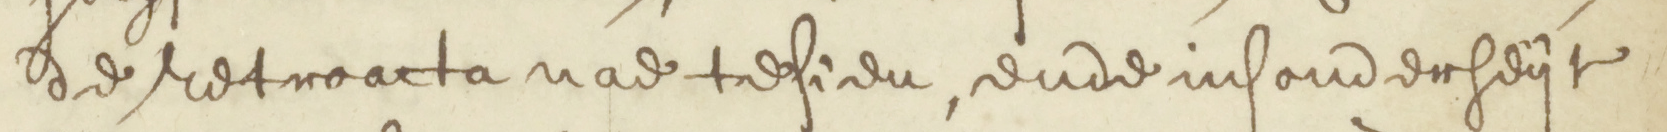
de retroacta nae tesien, ende insonderheijt
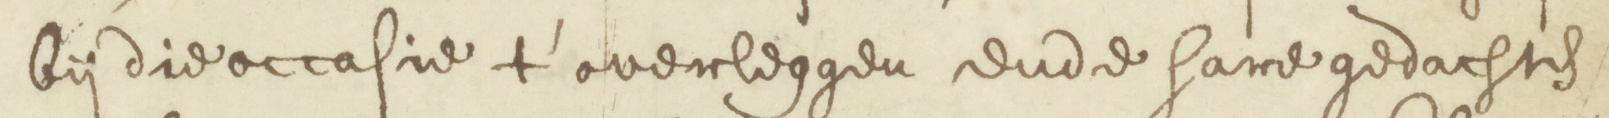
bij die occasie t'overleggen ende hare gedachten
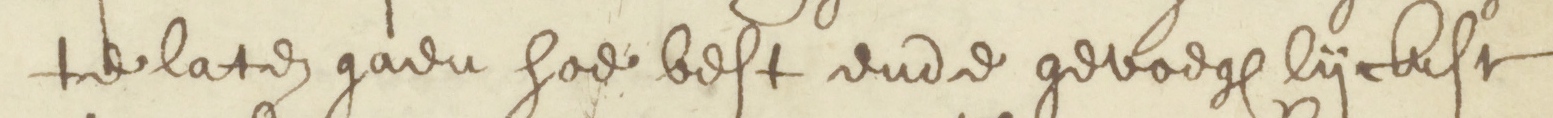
te laten gaen hoe best ende gevoeghlijckst
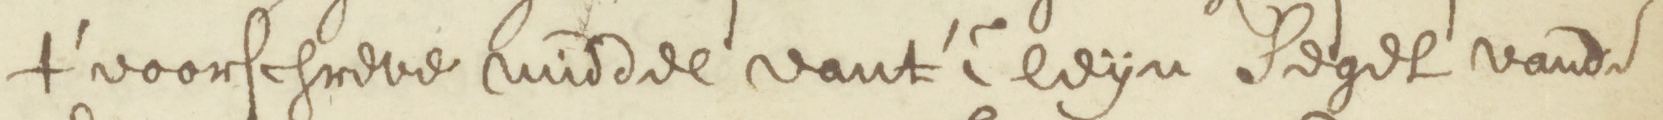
t'voorschreve middel vant' Cleijn Segel vande
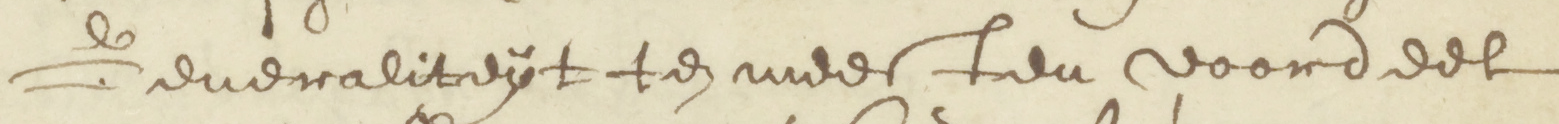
Generaliteijt ten meesten voordeel
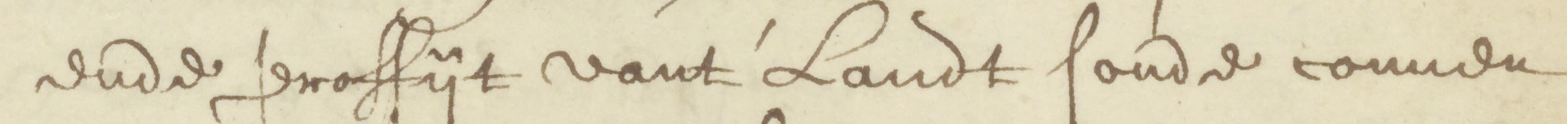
ende proffijt vant‛ Landt soude connen
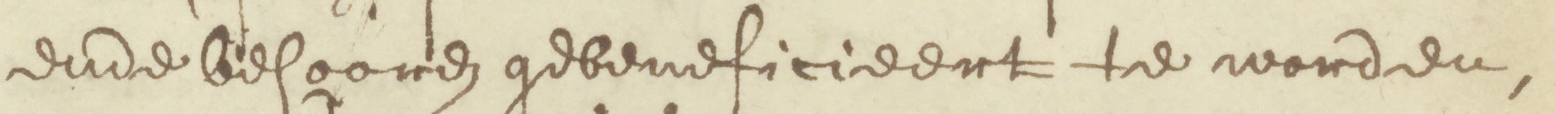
ende behooren gebeneficieert te worden,
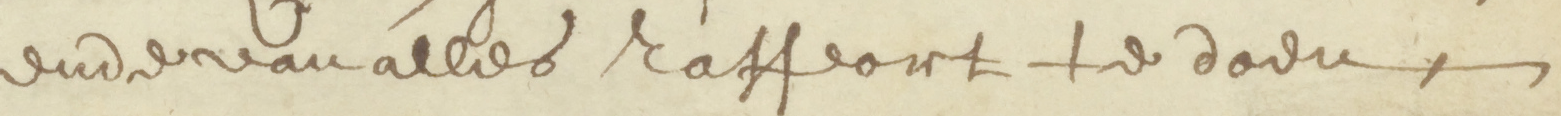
ende van alles rapport te doen,
